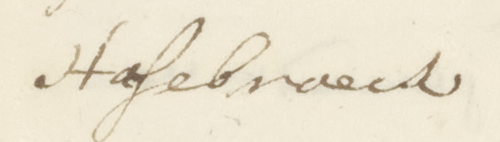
Hasebroeck
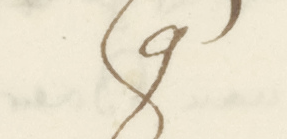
Ca
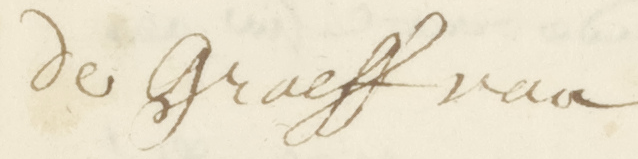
de Graeff van
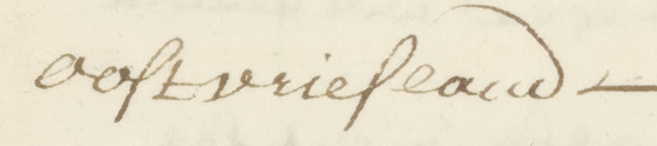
oostvrieslandt
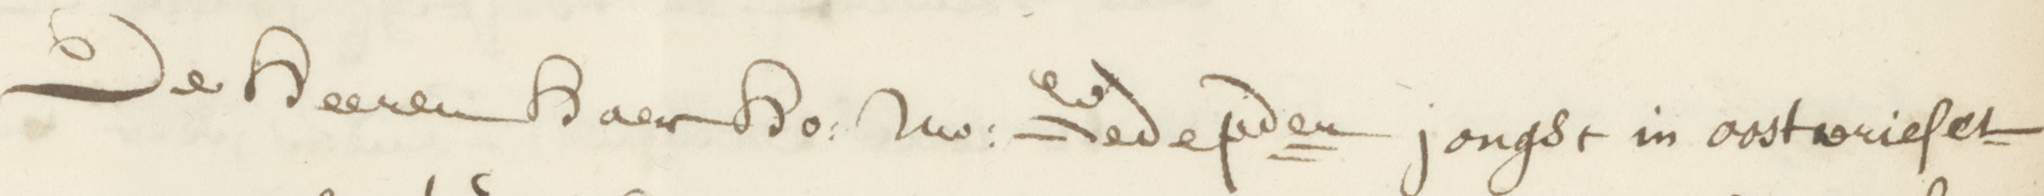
De Heeren haer Ho:Mo: Gedepden jongst in oostvrieslt
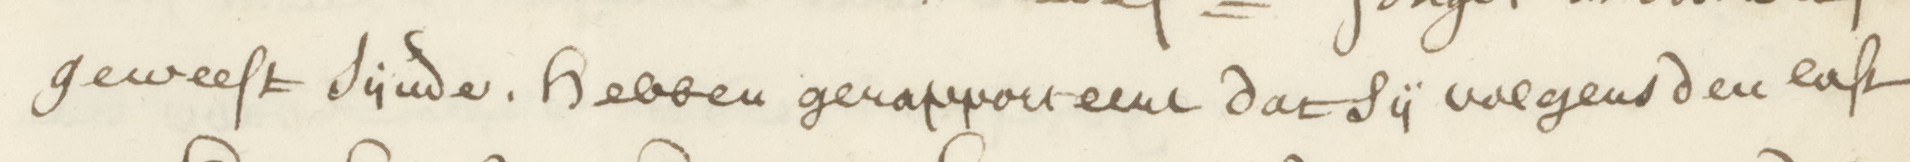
geweest sijnde, hebben gerapporteert dat sij volgens den last
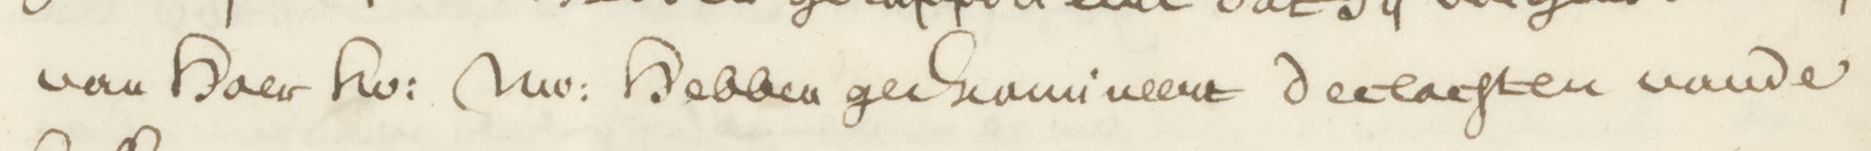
van Haer Ho:Mo: hebben geexamineert de clachten vande
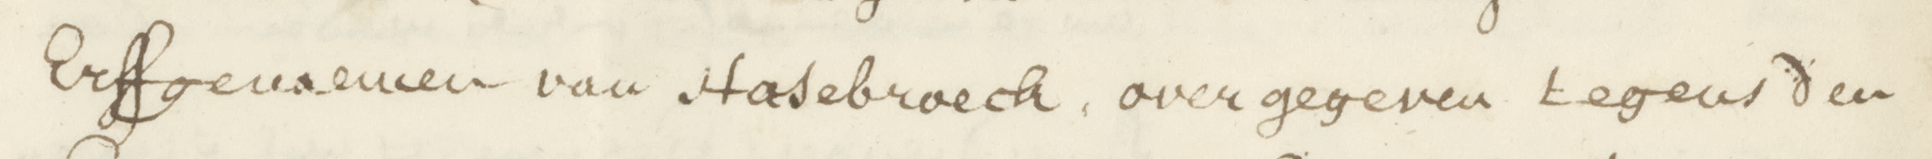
Erffgenaemen van Hasebroeck, overgegeven tegens den
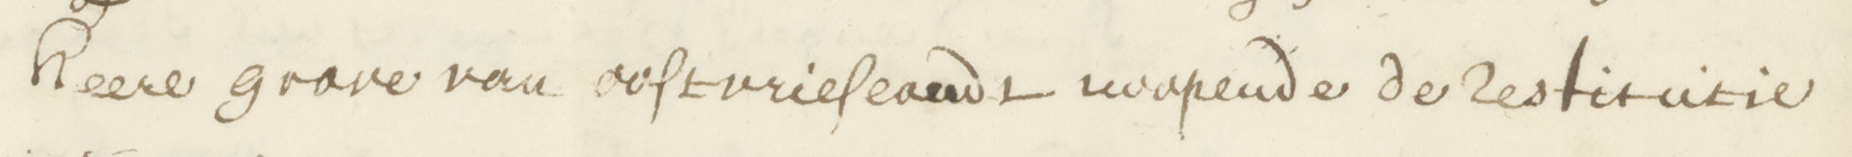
heere grave van oostvrieslandt noopende de restitutie
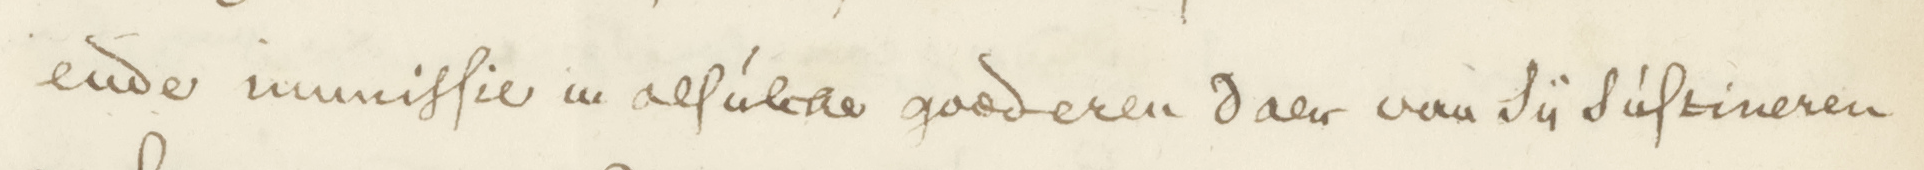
ende immissie in alsulcke goederen daer van sij sustineren
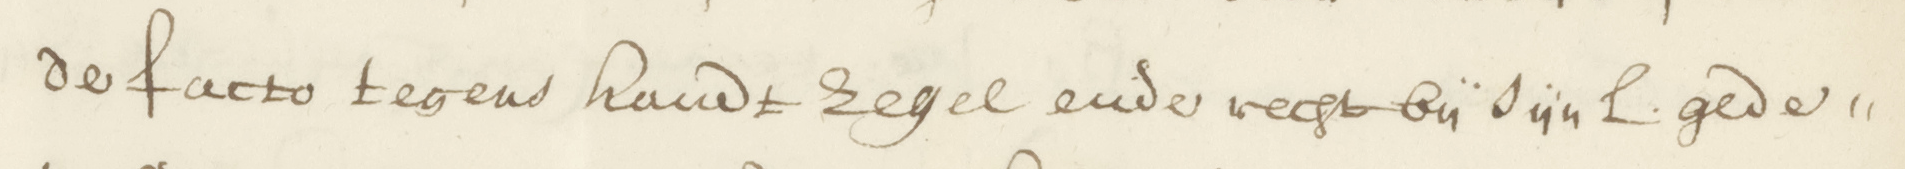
de facto tegens handt zegel ende recht bij sijn L. gede„
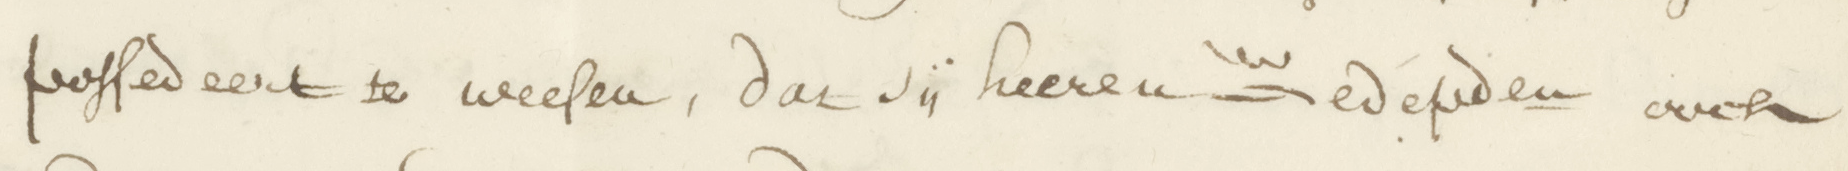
possedeert te weesen, dat sij heeren Gedepden oock
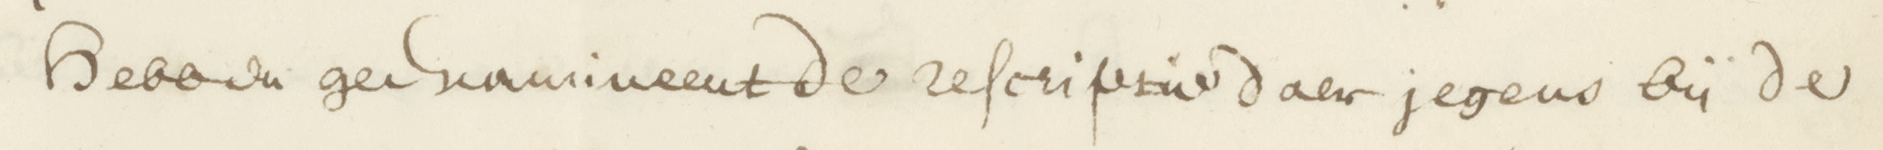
hebben geexamineert de rescriptie daer jegens bij de
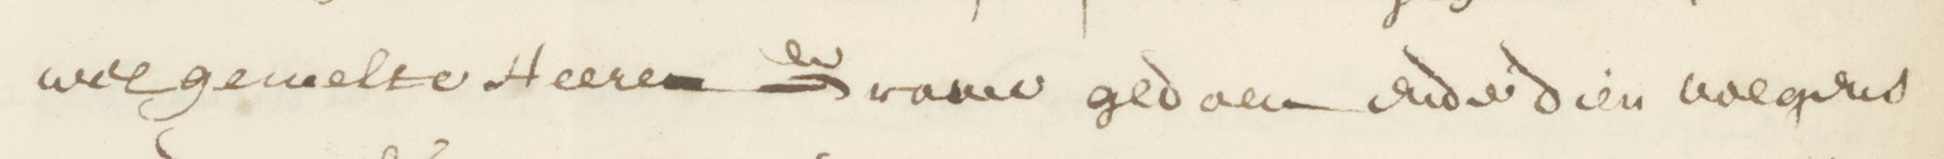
welgemelte Heere Grave gedaen ende dan volgens
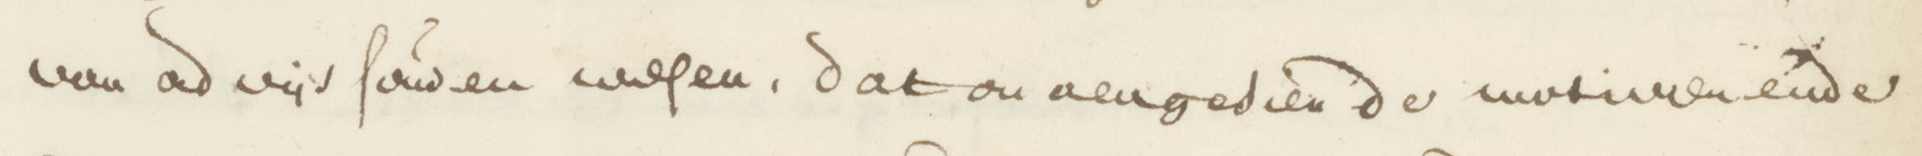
van advijs souden wesen, dat onaengesien de motieven ende
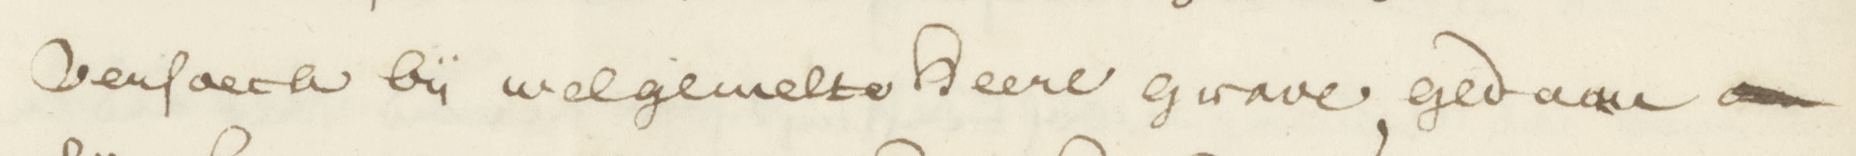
versoeck bij welgemelte Heere Grave gedaen
